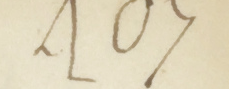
407
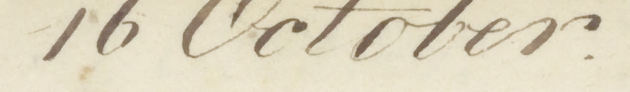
16 October.
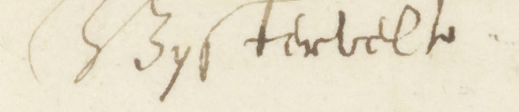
Bijstervelt,
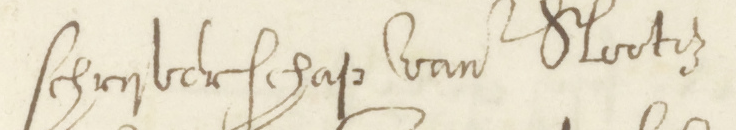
schryverschap van Slooten
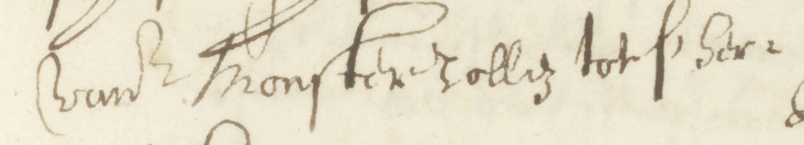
van monsterrollen tot s' Her,,
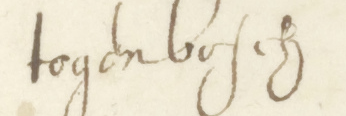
togenbosch
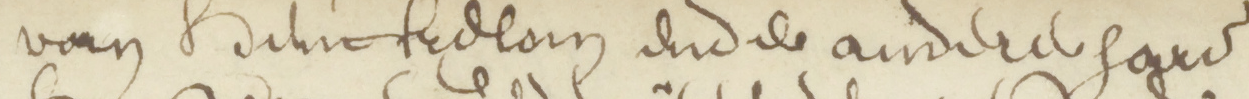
van Heuckelom ende andere hare
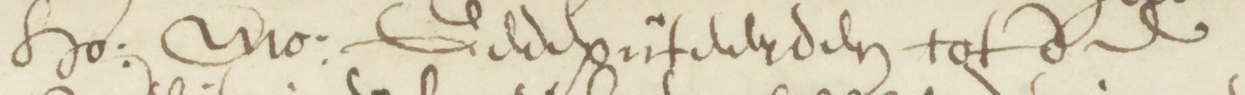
Ho:Mo: Gedeputeerden tot de
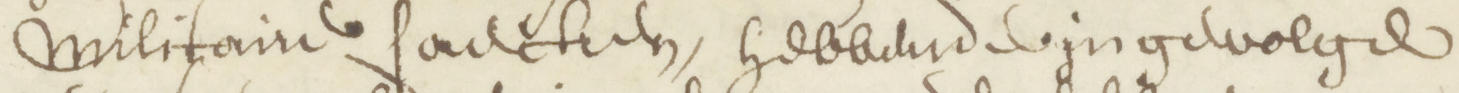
militaire saecken, hebbende ingevolge
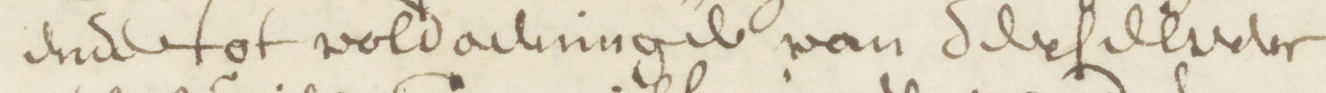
ende tot voldaeninge van derselver
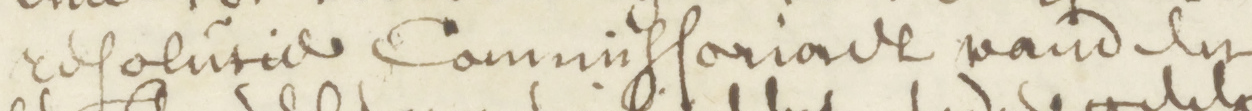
resolutie Commissoriael vanden
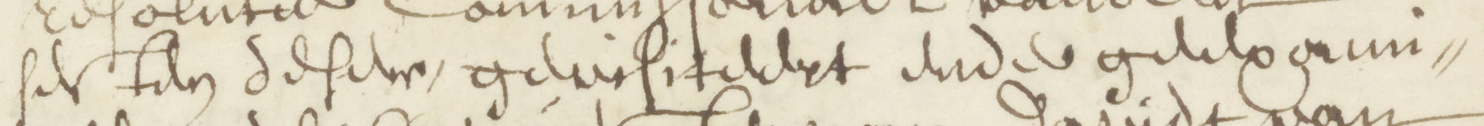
sesten deser, gevisiteert ende geexami,,
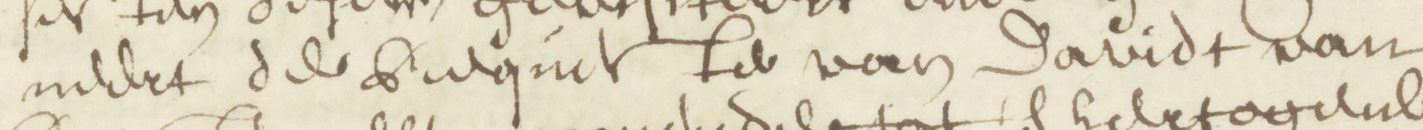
neert de requeste van Davidt van
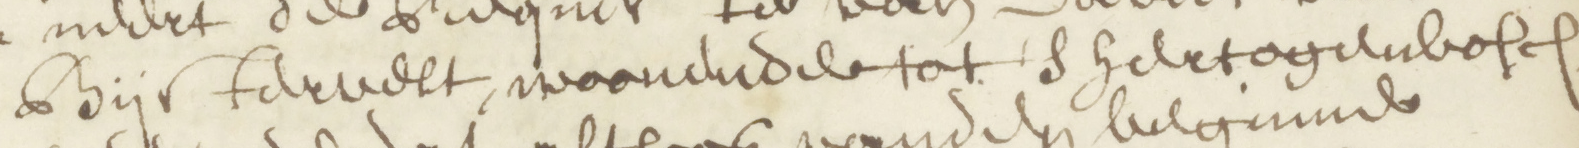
Bijstervelt, woonende tot 's Hertogenbosch
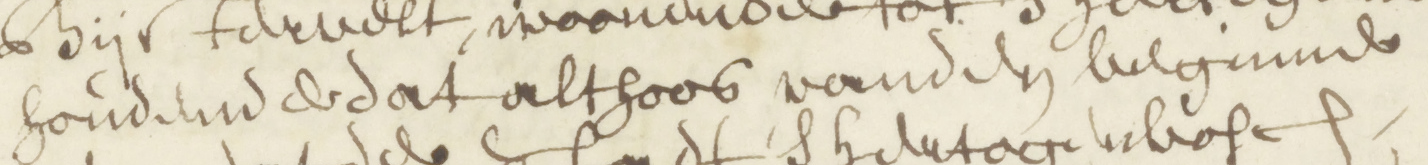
houdende dat althoos vanden beginne
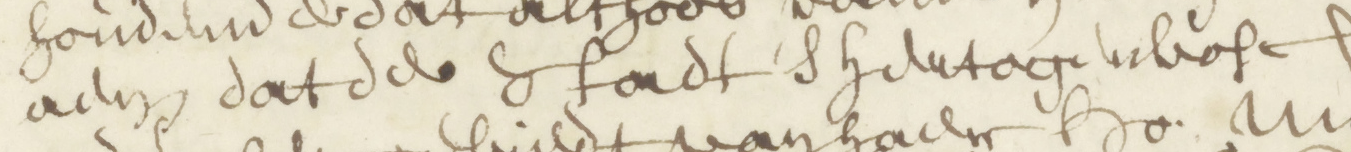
aen, dat de Stadt 's Hertogenbosch,
